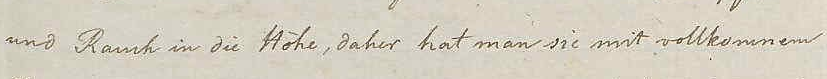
und Rauch in die Höhe, daher hat man sie mit vollkomnem
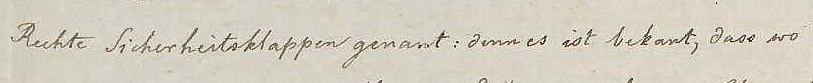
Rechte Sicherheitsklappen genant: denn es ist bekant, dass wo
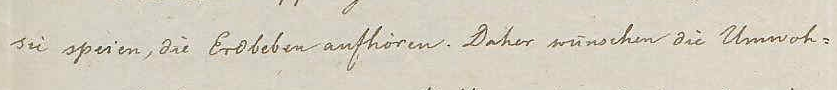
sie speien, die Erdbeben aufhören. Daher wünschen die Umwoh-
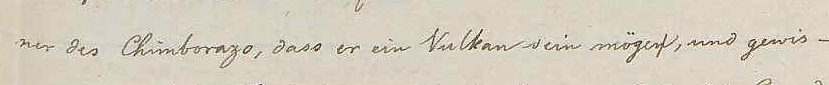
ner des Chimborazo, dass er ein Vulkan sein mögen, und gewis –
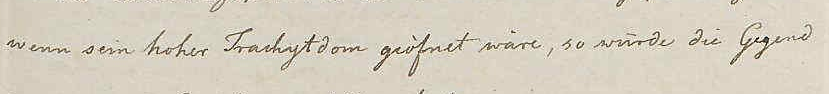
wenn sein hoher Trachytdom geöfnet wäre, so würde die Gegend
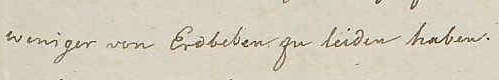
weniger von Erdbeben zu leiden haben.
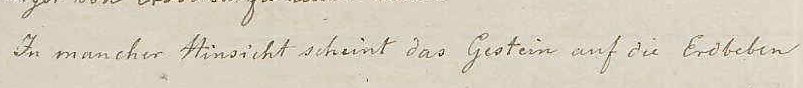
In mancher Hinsicht scheint das Gestein auf die Erdbeben
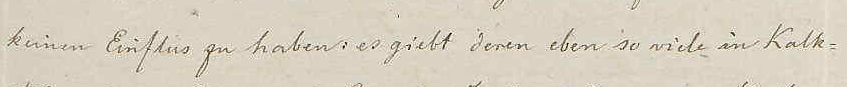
keinen Einflus zu haben: es giebt denen eben so viele in Kalk-
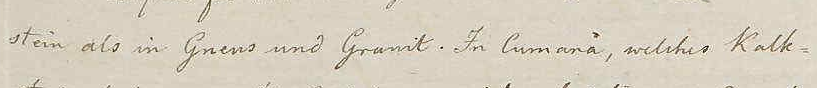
stein als in Gneus und Granit. In Cumanà, welches Kalk-
